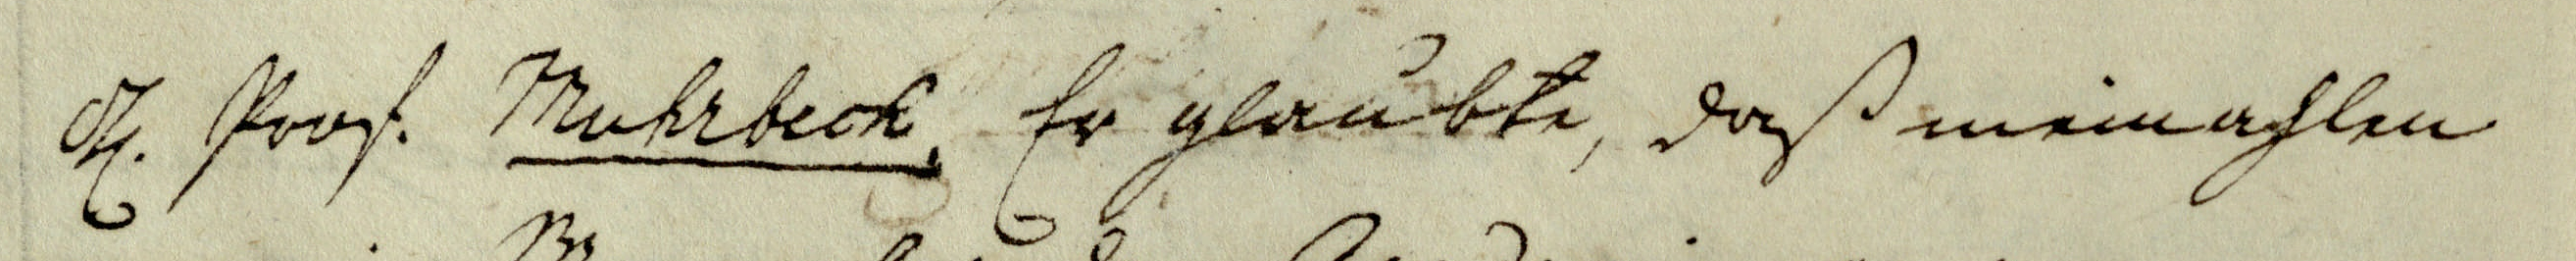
dh. Prof. Muhrbeck. Er glaubte, daß niemahlen
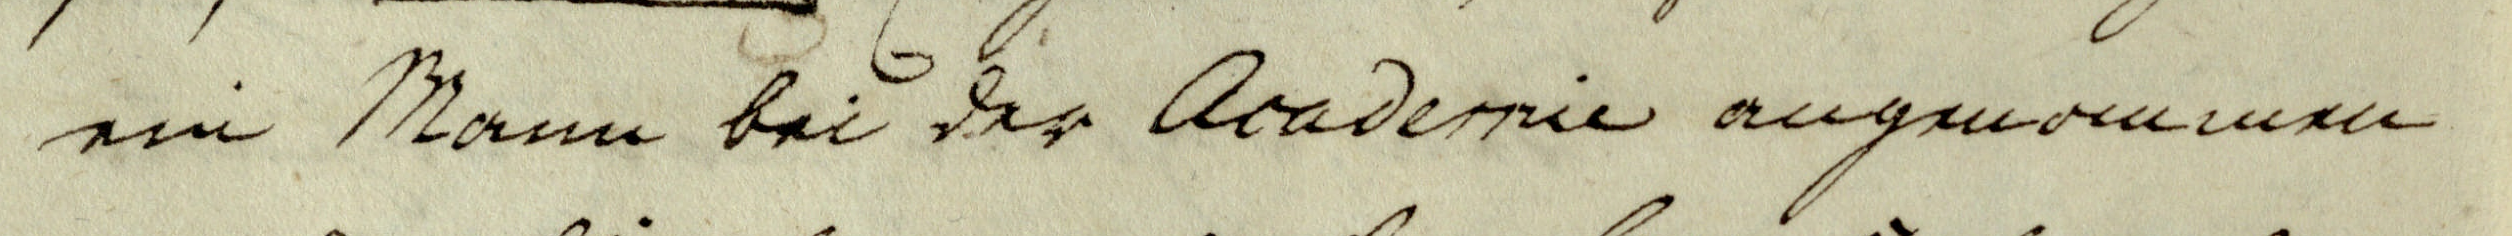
ein Mann bei der Academie angenommen
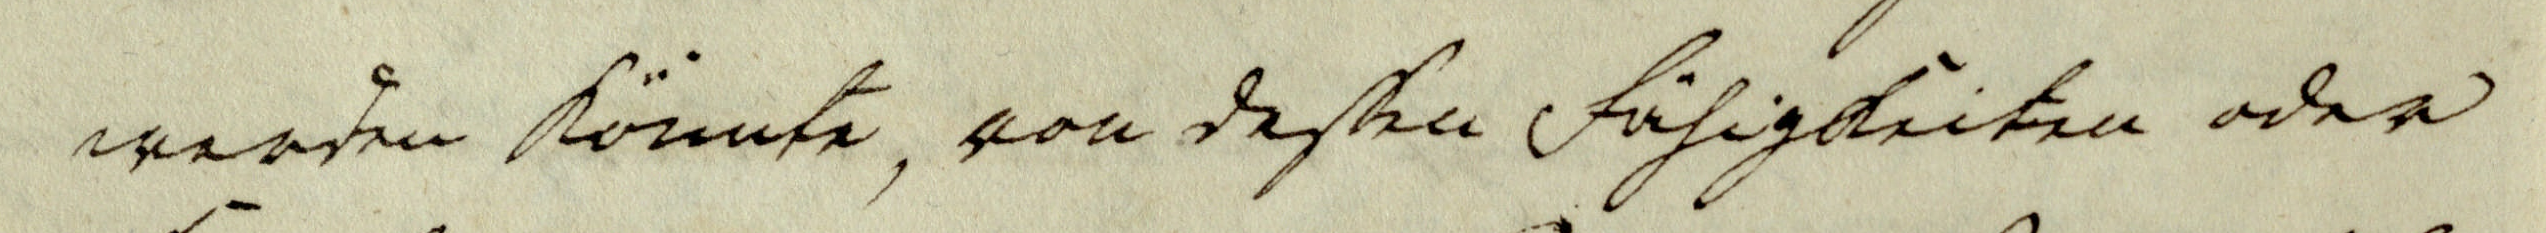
werden könnte, von dessen Fähigkeiten oder
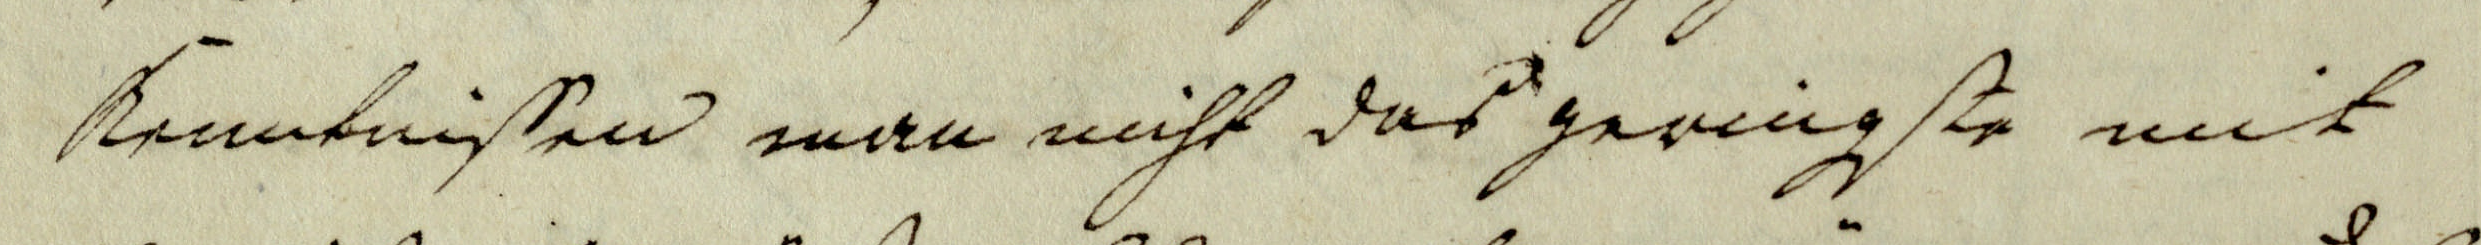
Kenntnissen man nicht das geringste mit
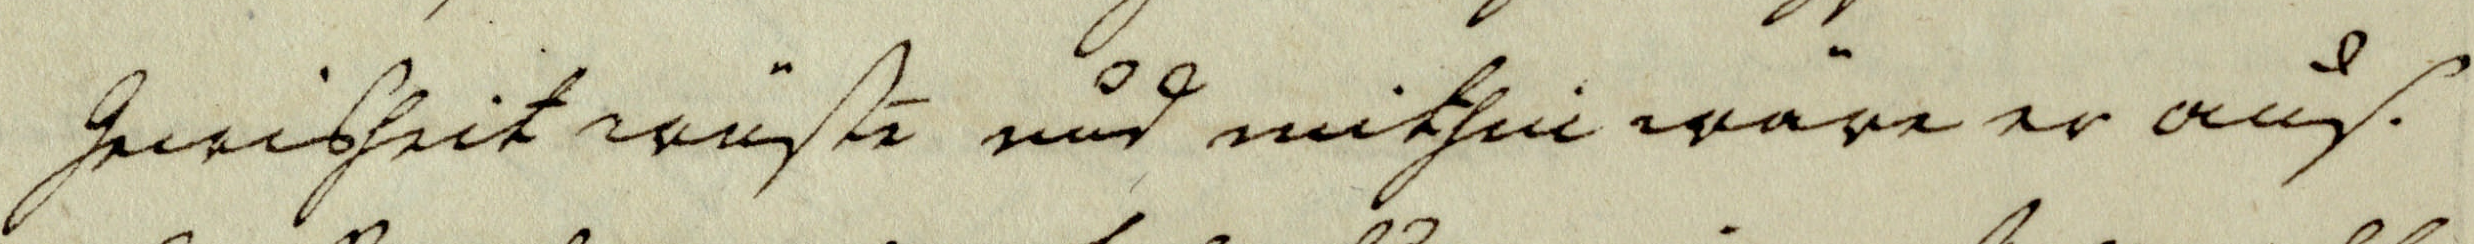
Gewisheit wüßte und mithin wäre er aus¬
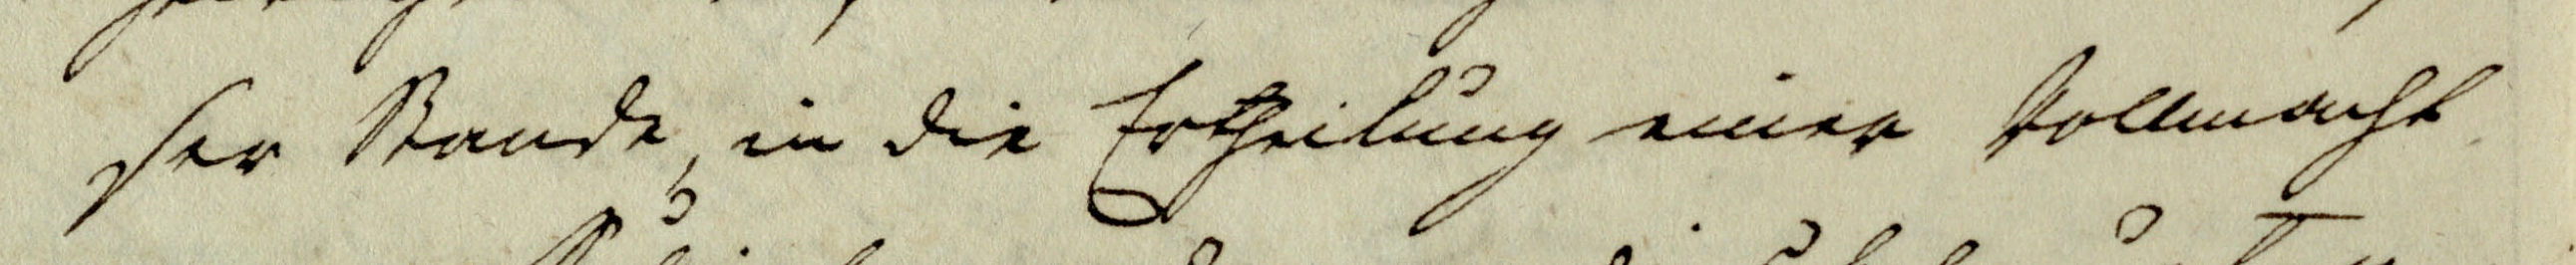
ser Stande, in die Ertheilung einer Vollmacht
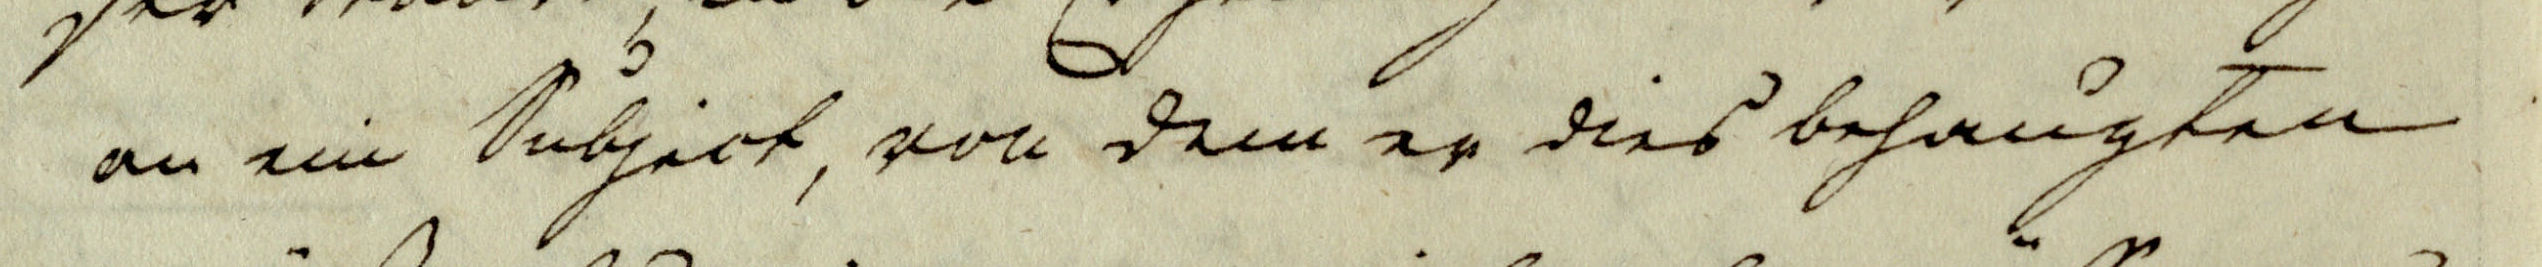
an ein Subject, von dem er dies behaupten
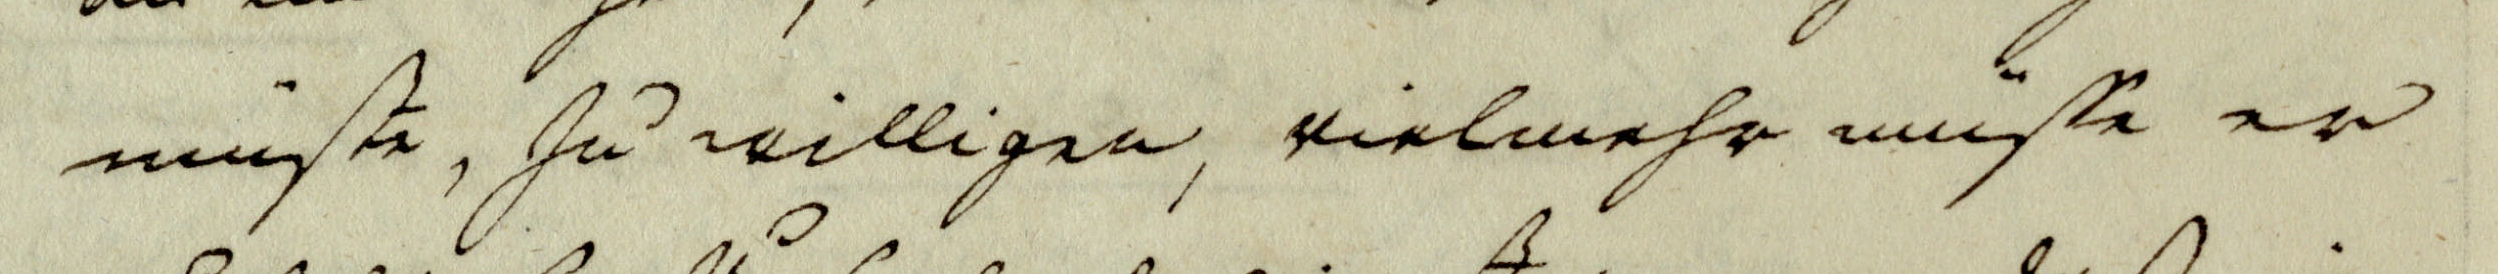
müßte, zu willigen, vielmehr müsse er
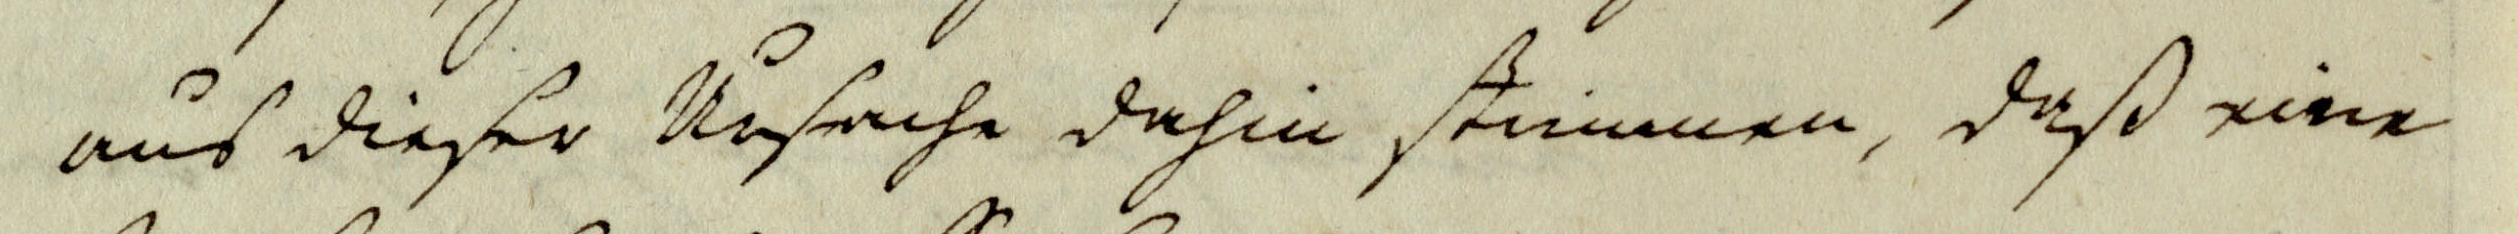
aus dieser Ursache dahin stimmen, daß eine
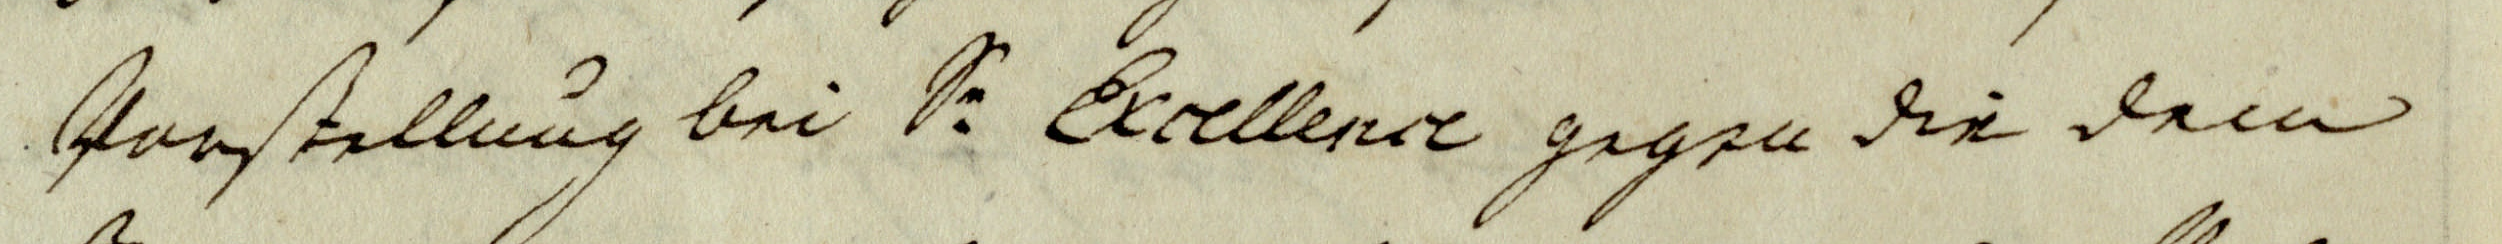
Vorstellung bei Sr Excellence gegen die dem
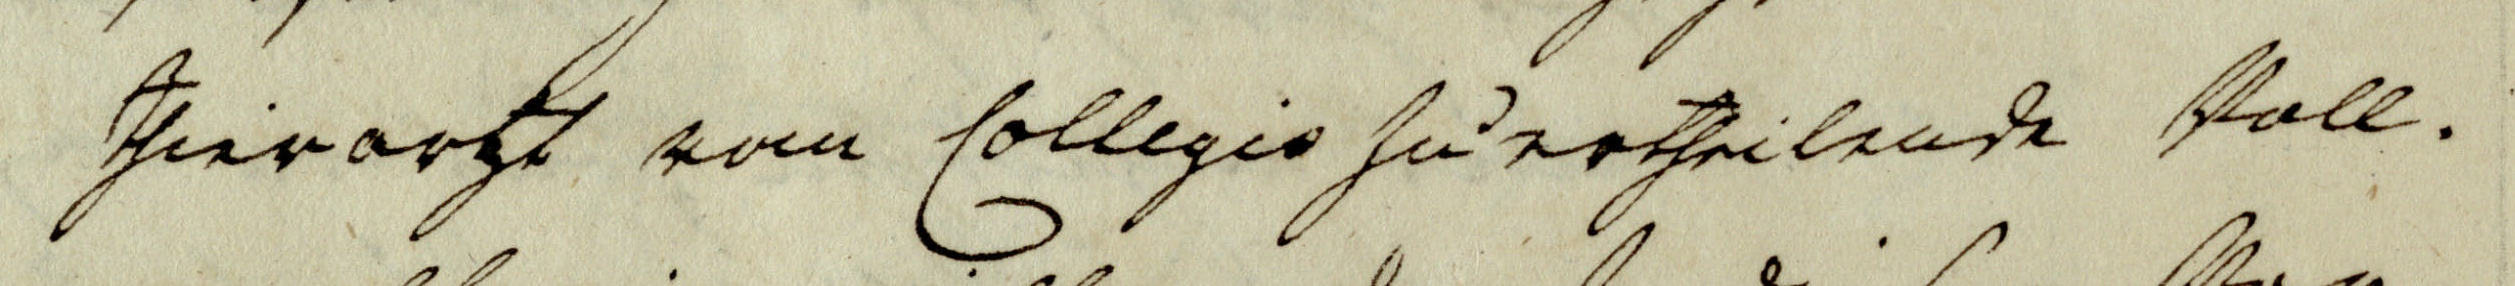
Thierartzt vom Collegio zu ertheilende Voll¬
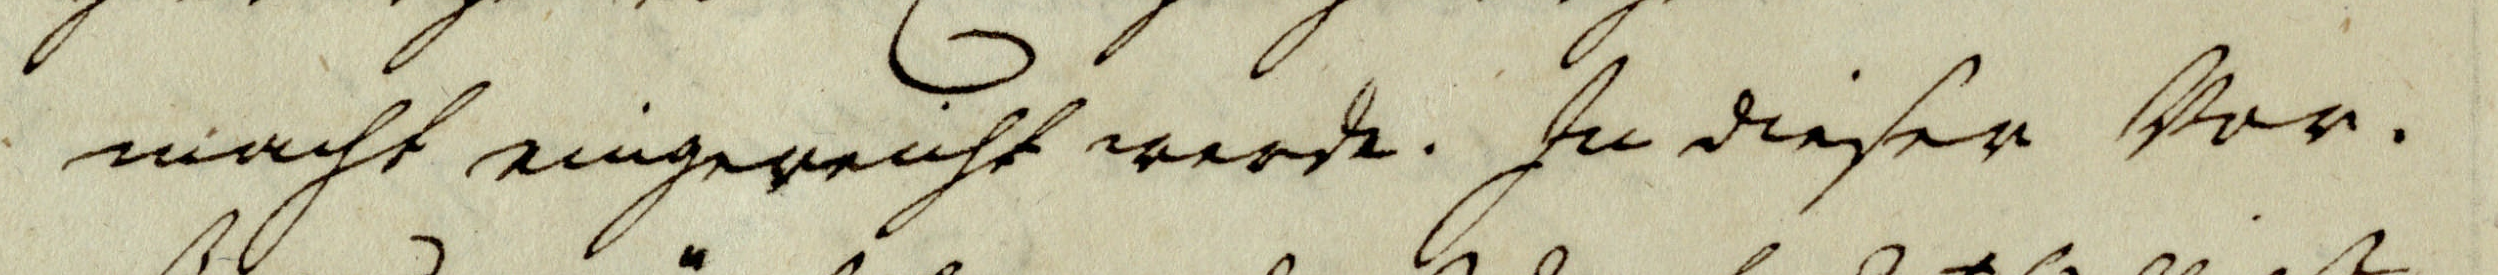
macht eingereicht werde. In dieser Vor¬
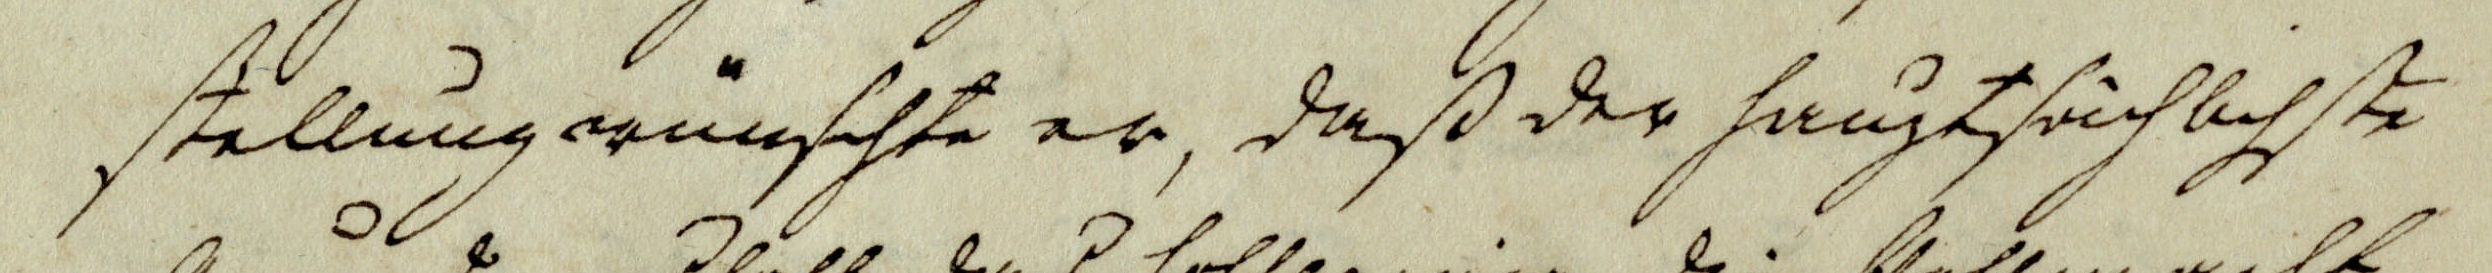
stellung wünschte er, daß der Hauptsächlichste
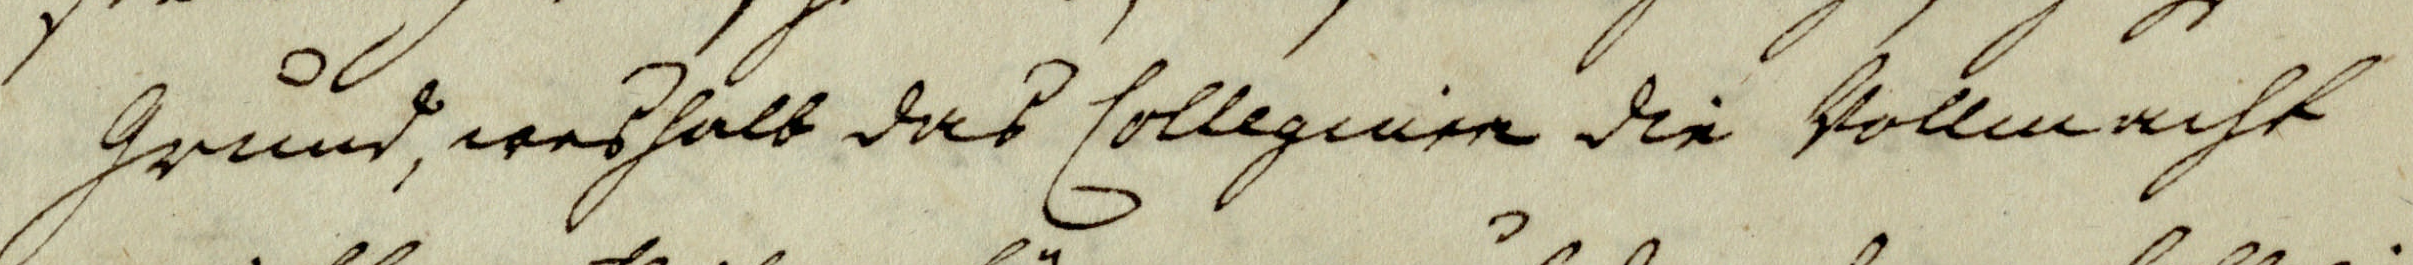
Grund, weshalb das Collegium die Vollmacht
